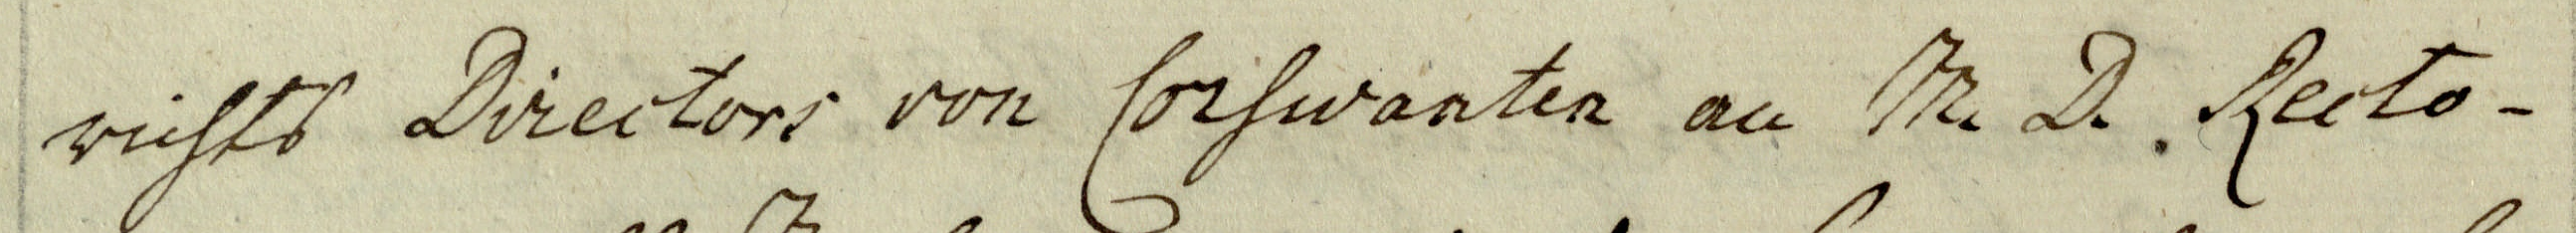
richts Directors von Corswanten an M. D. Recto¬
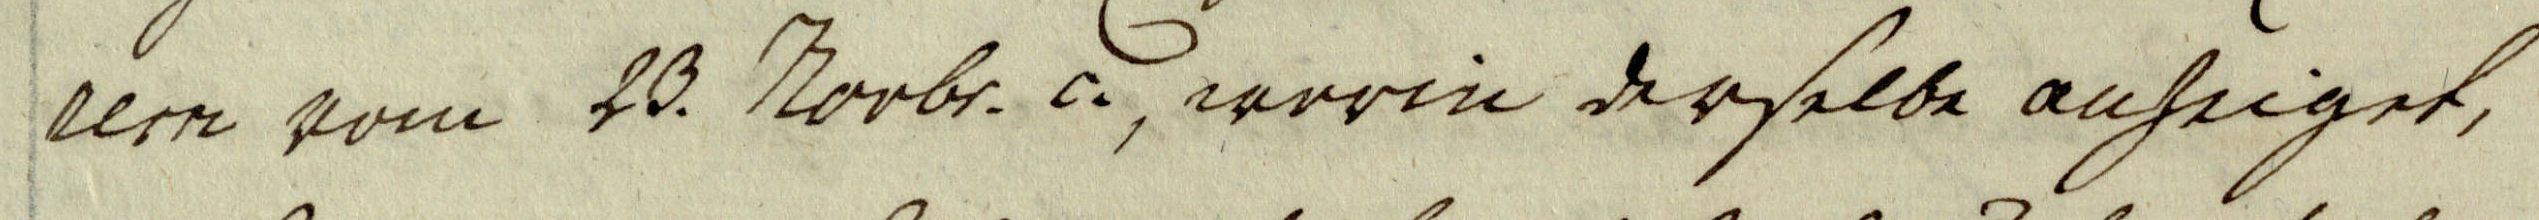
rem vom 23. Novbr. c., worin derselbe anzeiget,
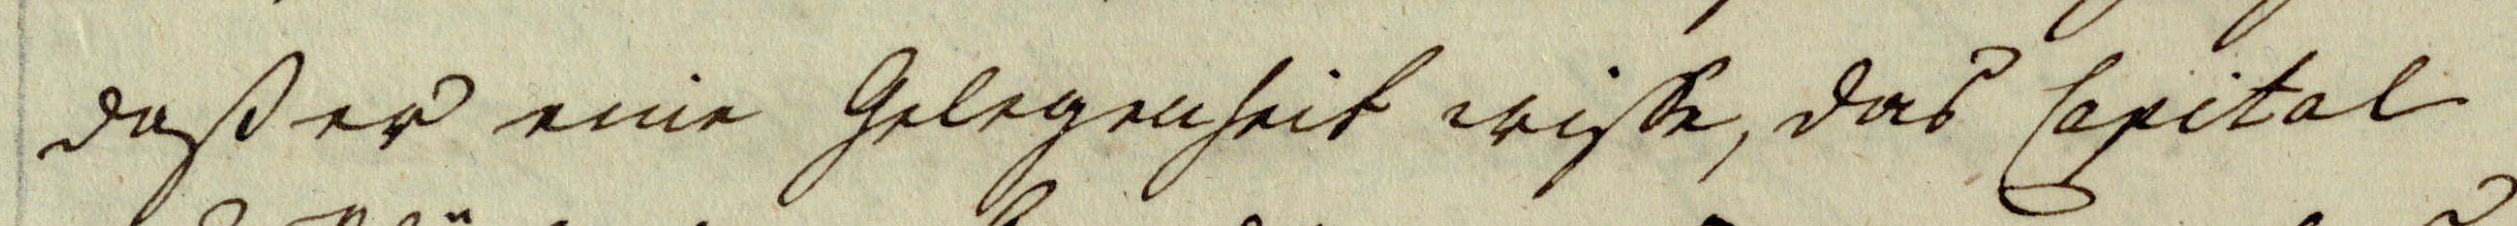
daß er eine Gelegenheit wisse, das Capital
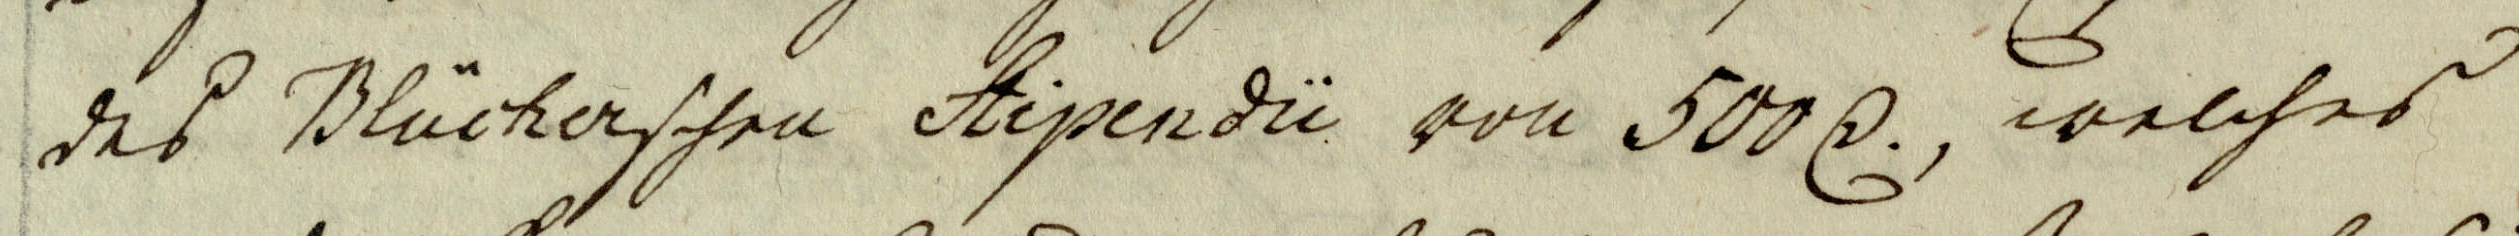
des Blücherschen Stipendii von 500 rtl., welches
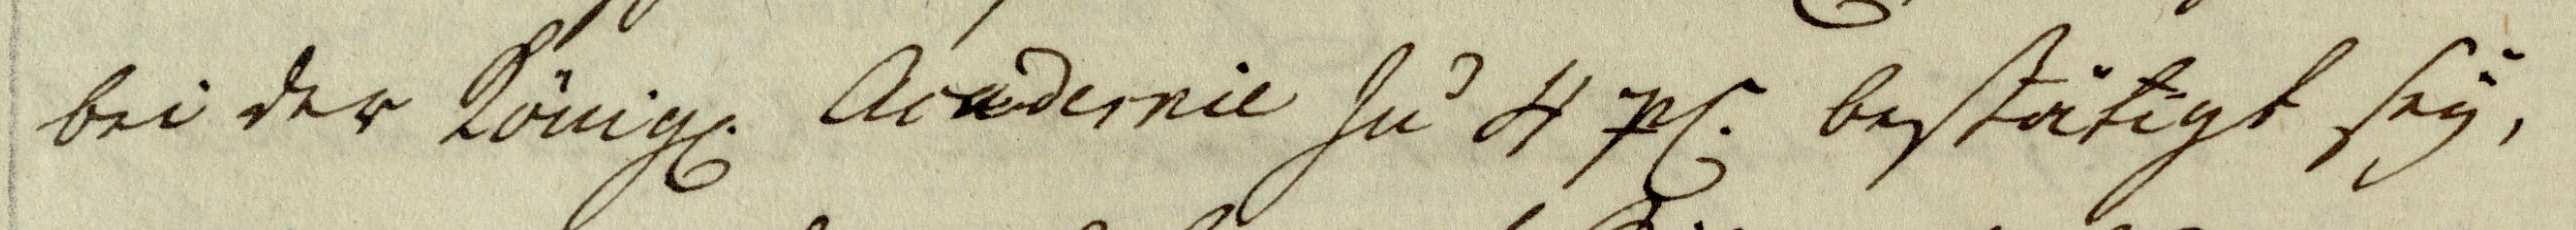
bei der Königl. Academie zu 4 xxx bestätigt seÿ,
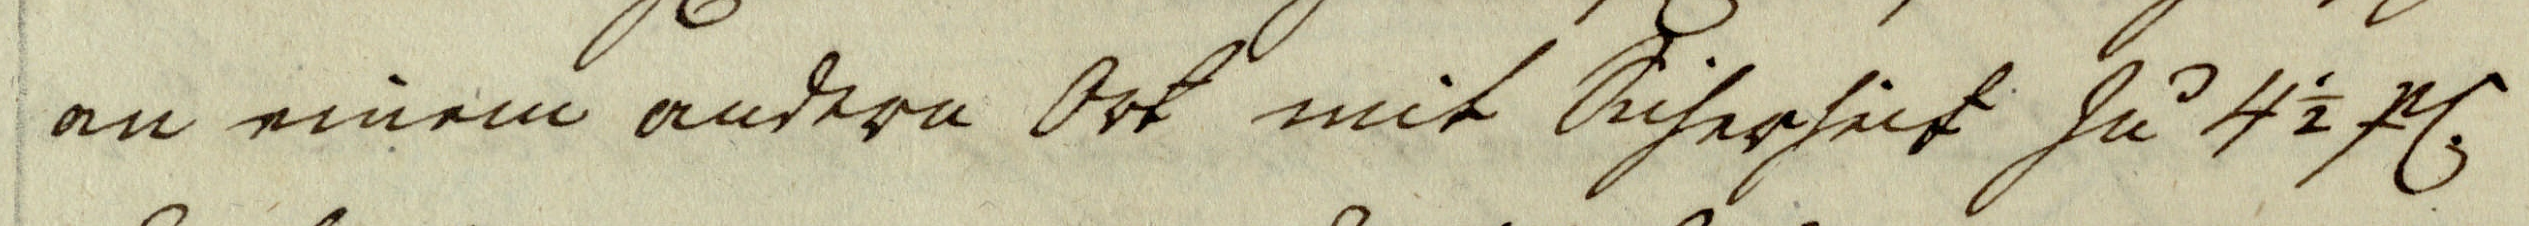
an einem andern Ort mit Sicherheit zu 4 1/2 xxx.
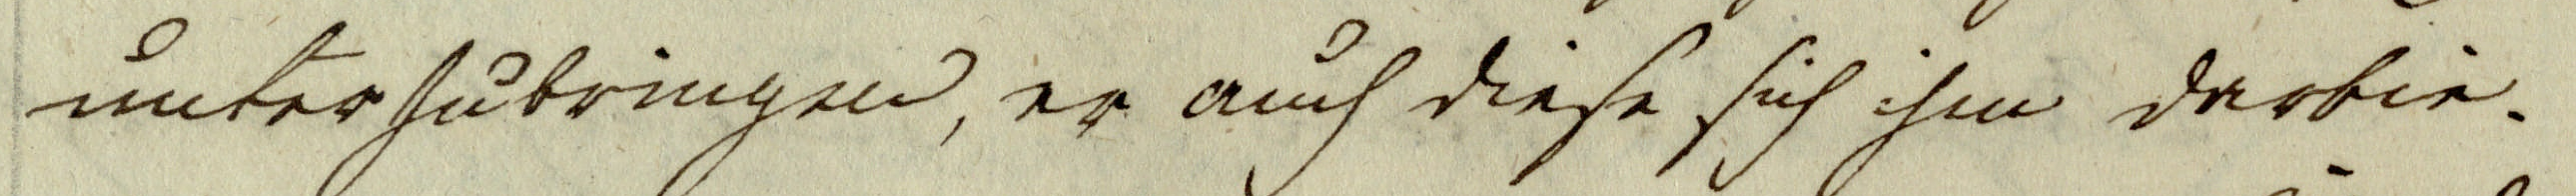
unterzubringen, er auch diese sich ihm darbie¬
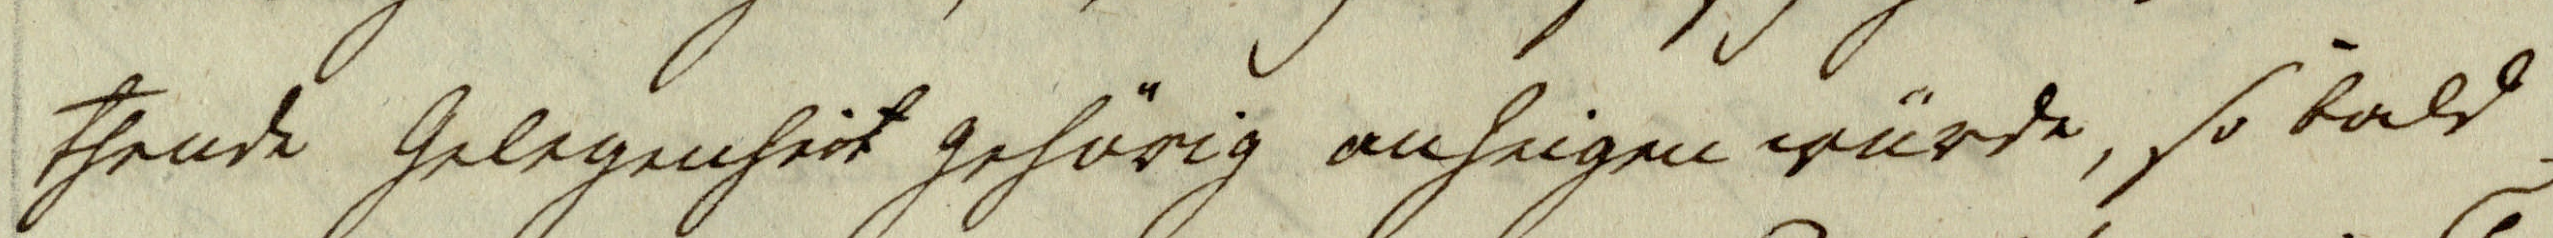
tende Gelegenheit gehörig anzeigen würde, so bald
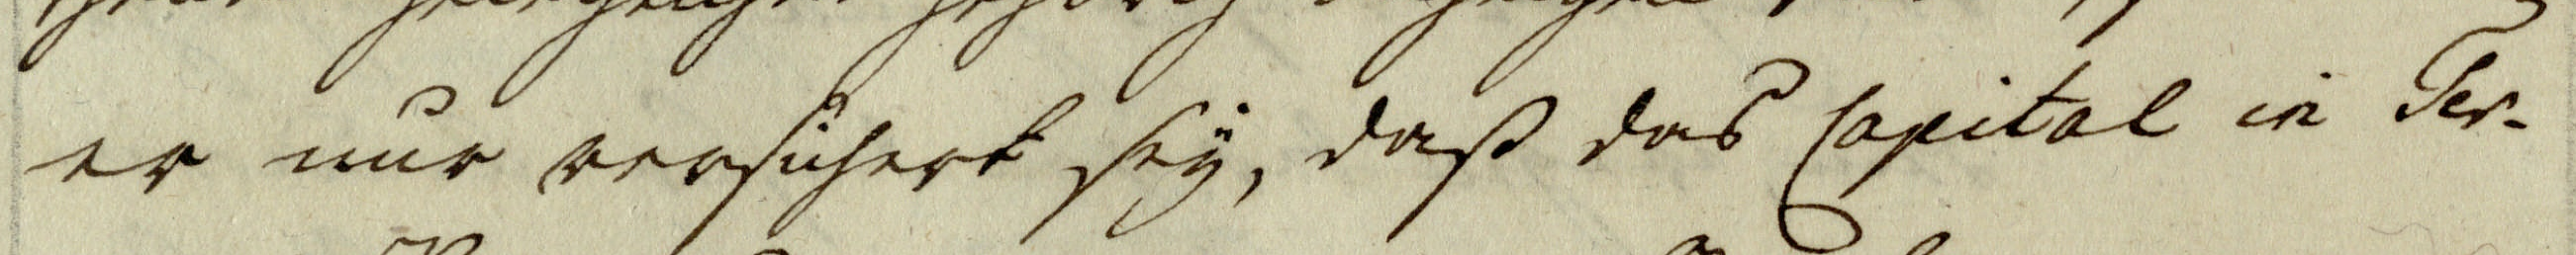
er nur versichert seÿ, daß das Capital in Ter¬
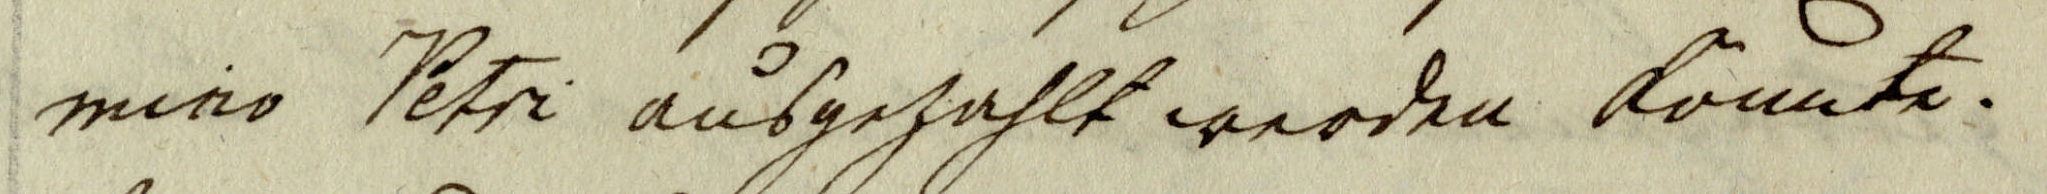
mino Petri ausgezahlt werden könnte.
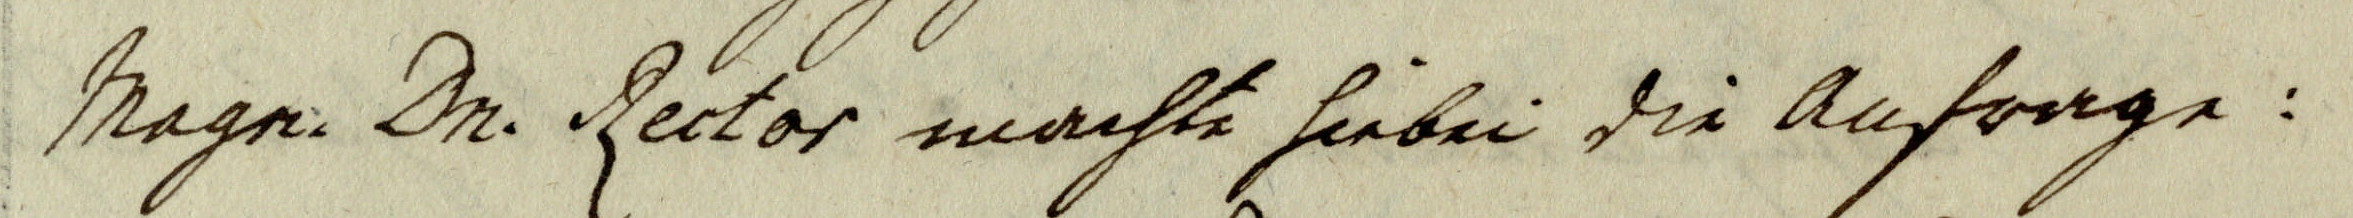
Magn. Dn. Rector machte hiebei die Anfrage:
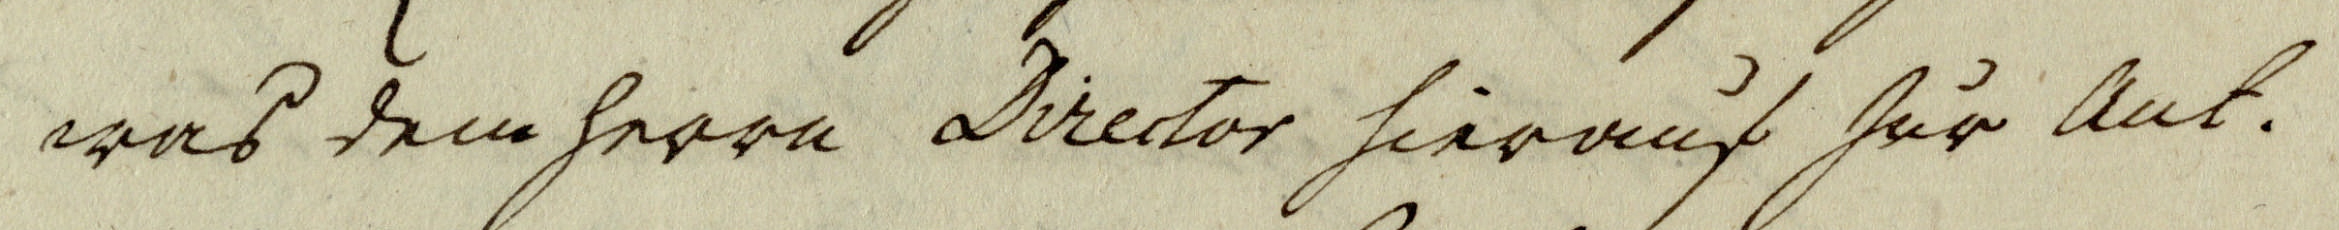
was dem Herrn Director hierauf zur Ant¬
